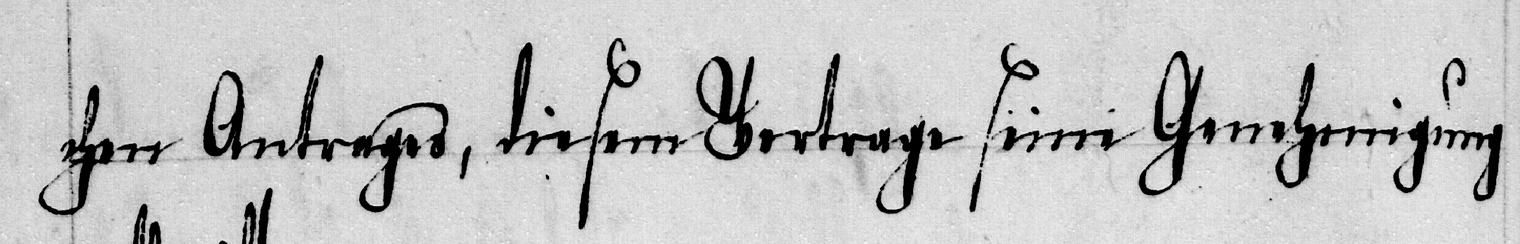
chen Antrages, diesem Vertrage seine Genehmigung
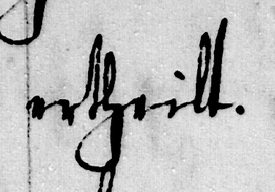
ertheilt.
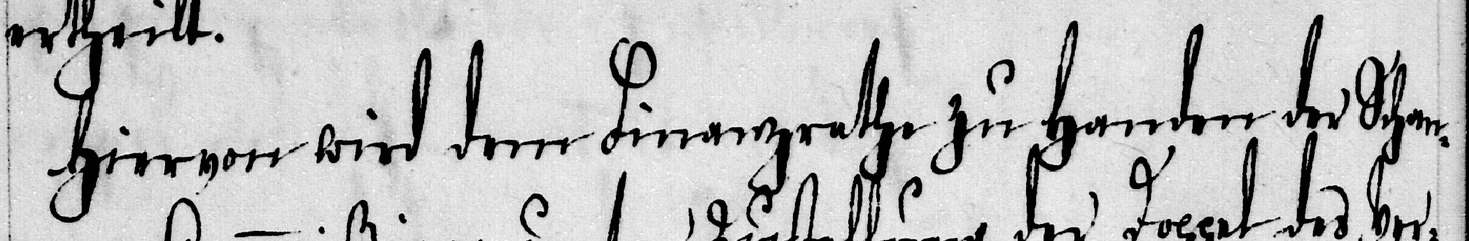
Hiervon wird dem Finanzrathe zu Handen der Sch¬
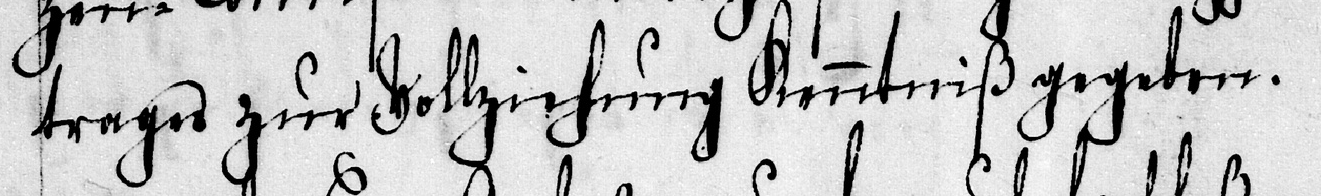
trages zur Vollziehung Kenntniß gegeben.
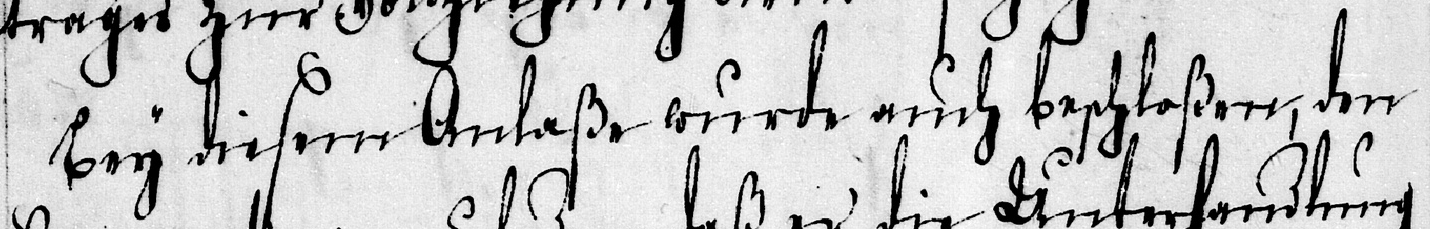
Bey diesem Anlaße wurde auch beschloßen, den
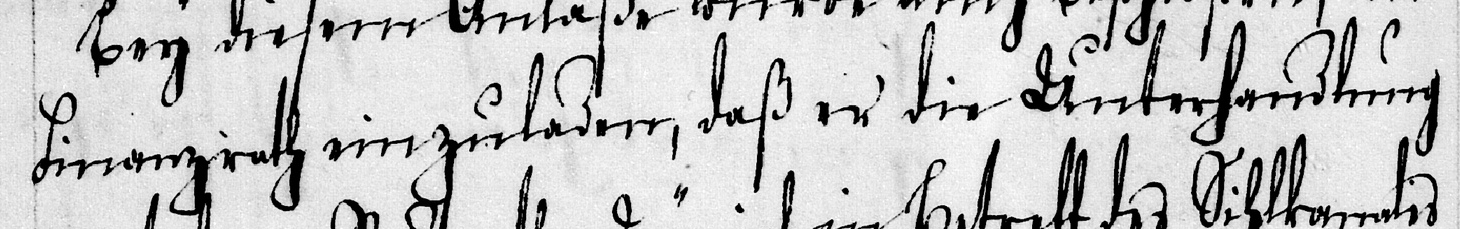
Finanzrath einzuladen, daß er die Unterhandlung
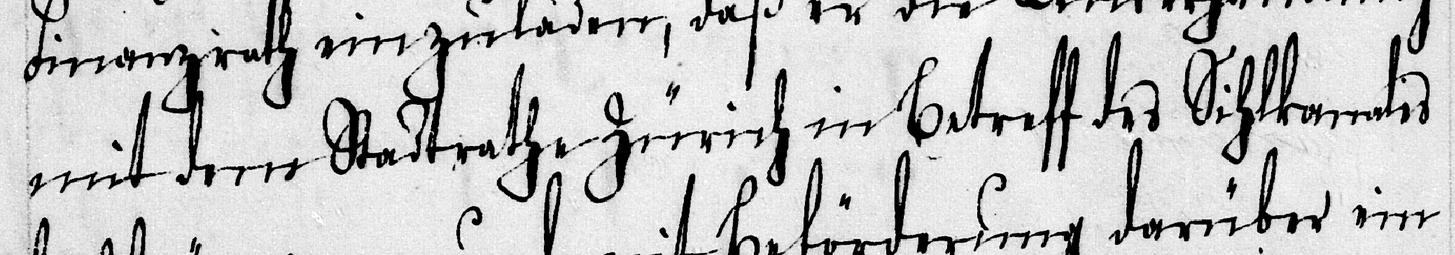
mit dem Stadtrathe Zürich in Betreff des Sihlkanales
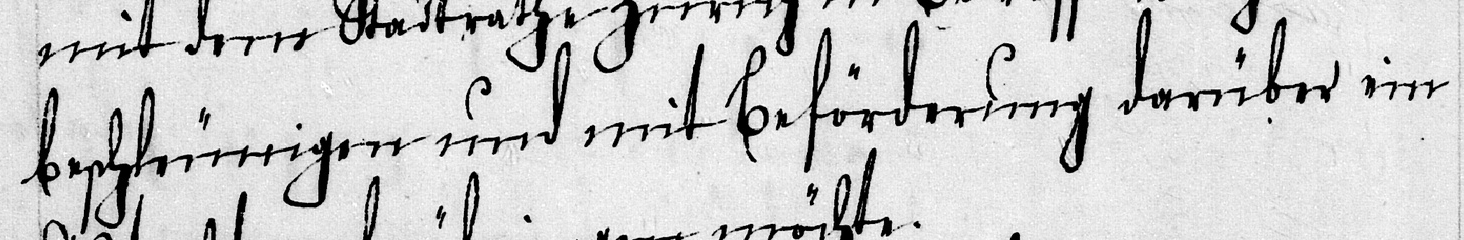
beschleunigen und mit Beförderung darüber ein
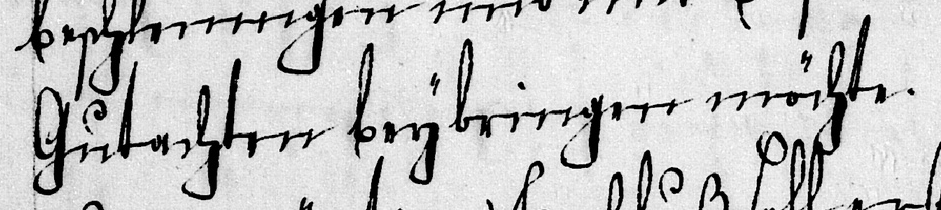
Gutachten beybringen möchte.
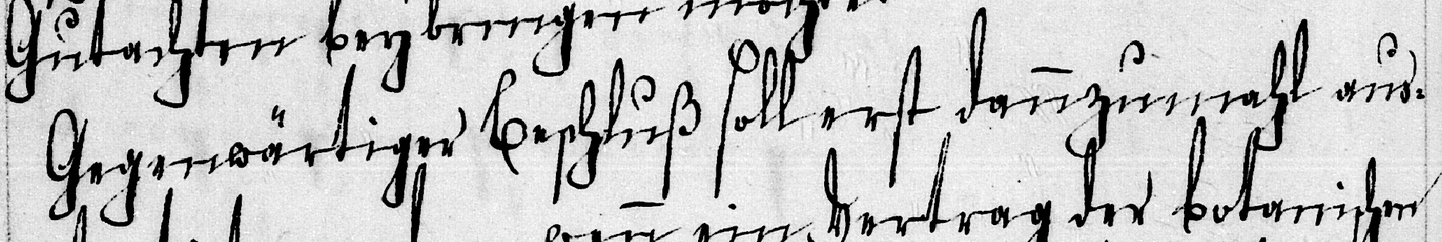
Gegenwärtiger Beschluß soll erst dannzumahl aus¬
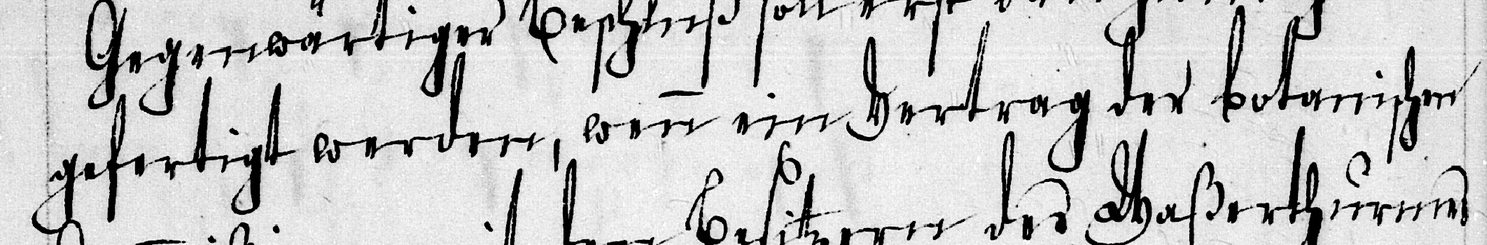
gefertigt werden, wenn ein Vertrag der botanischen
